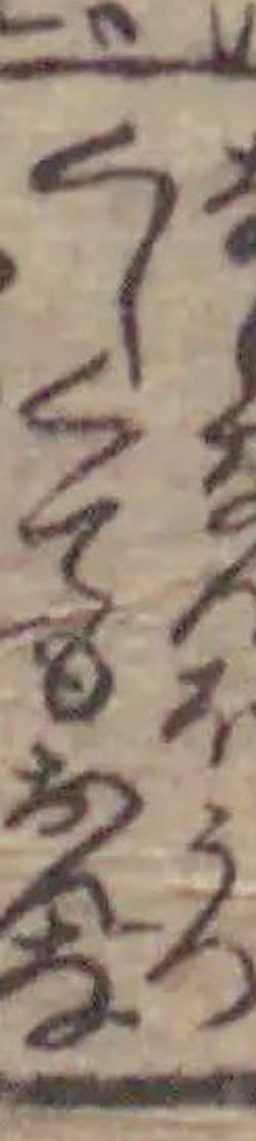くしくてもおんな
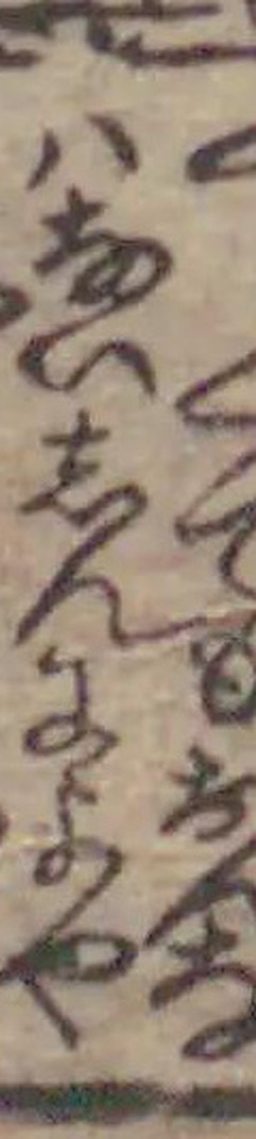はないしんによや
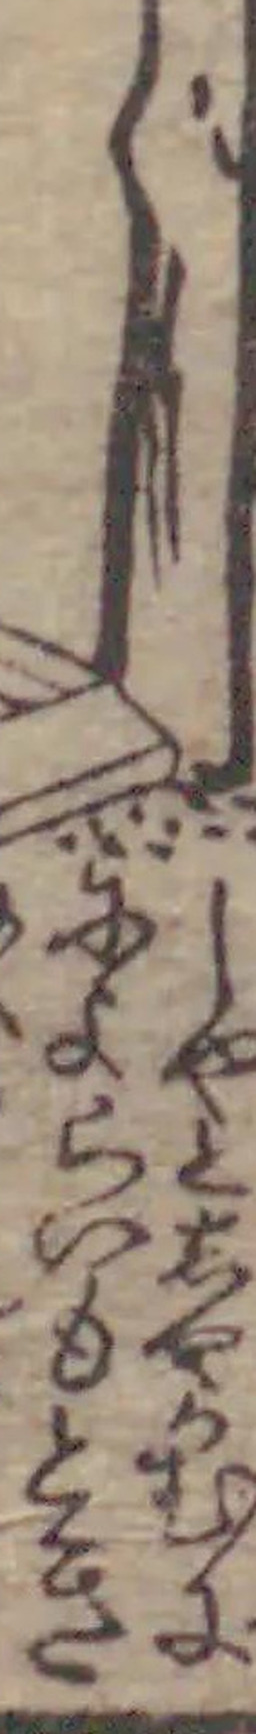によらいもとき
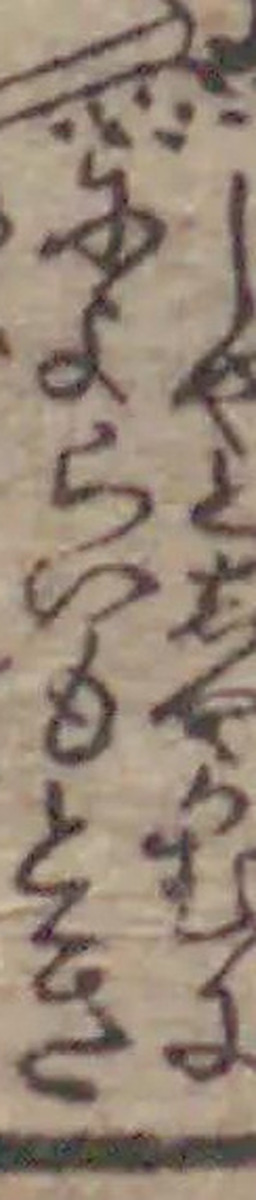によらいもとき
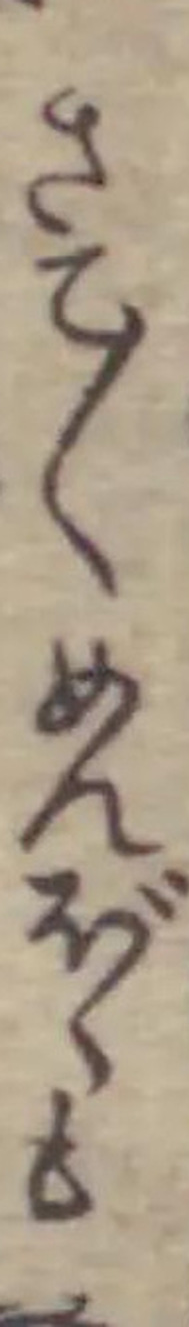さて〳〵めんぼくも
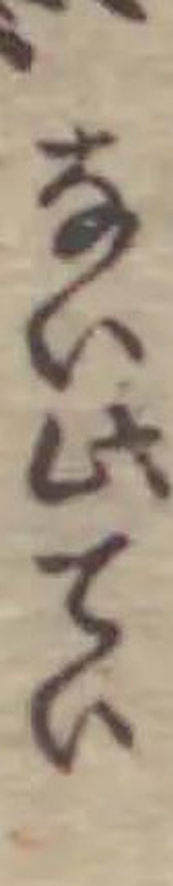ない此てい
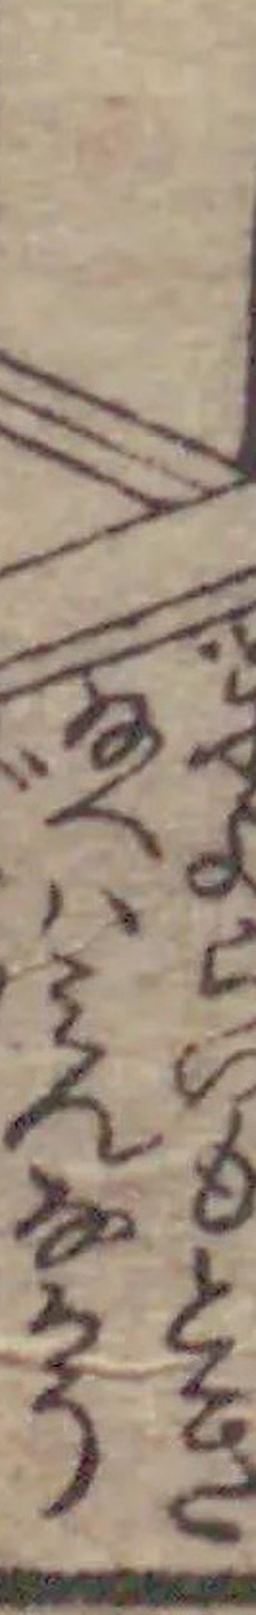給へはみんなかう
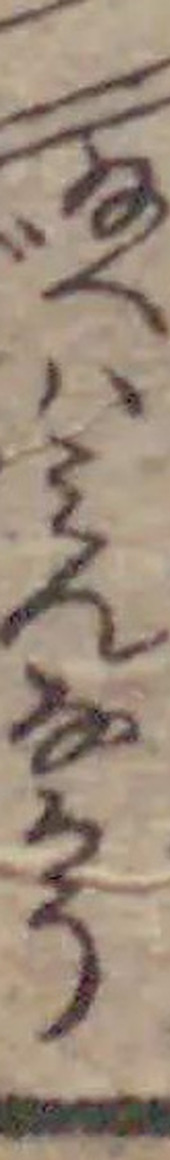給へはみんなかう
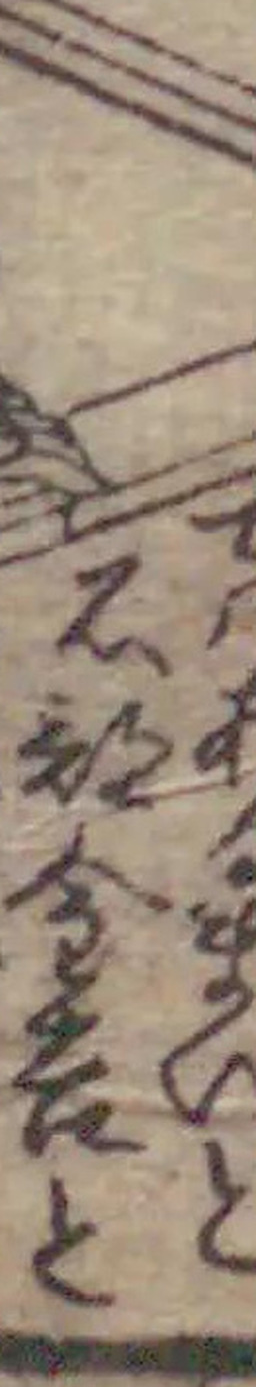石部金吉と
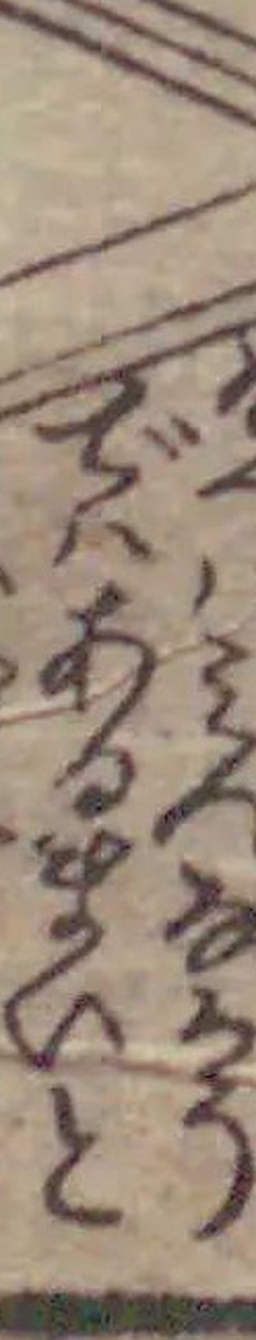ではあるまいと
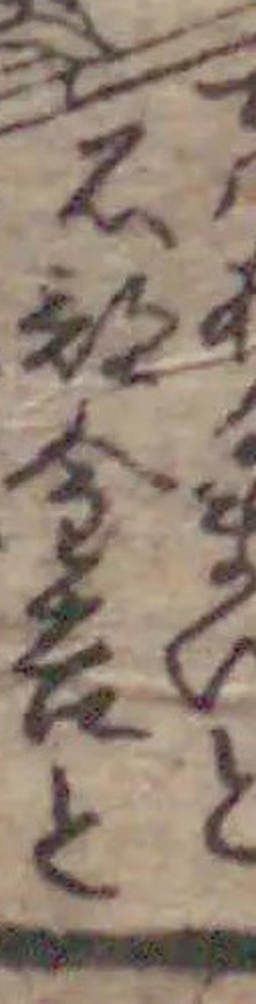石部金吉と
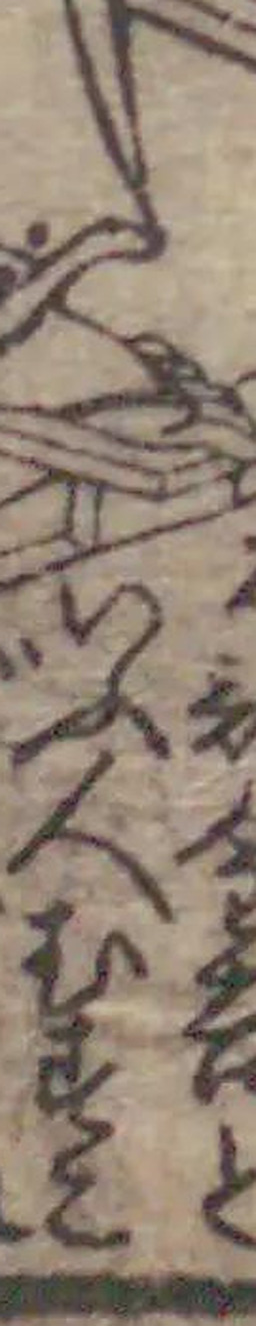いふ人むすこ
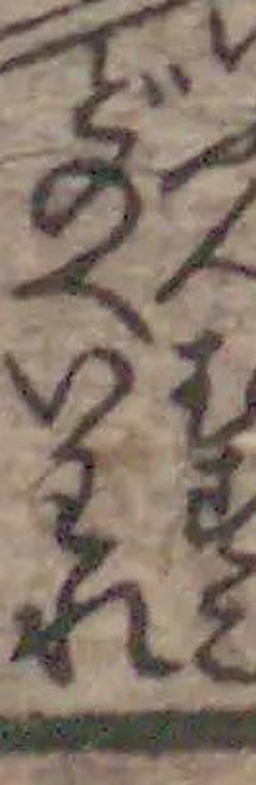どのへいわれ

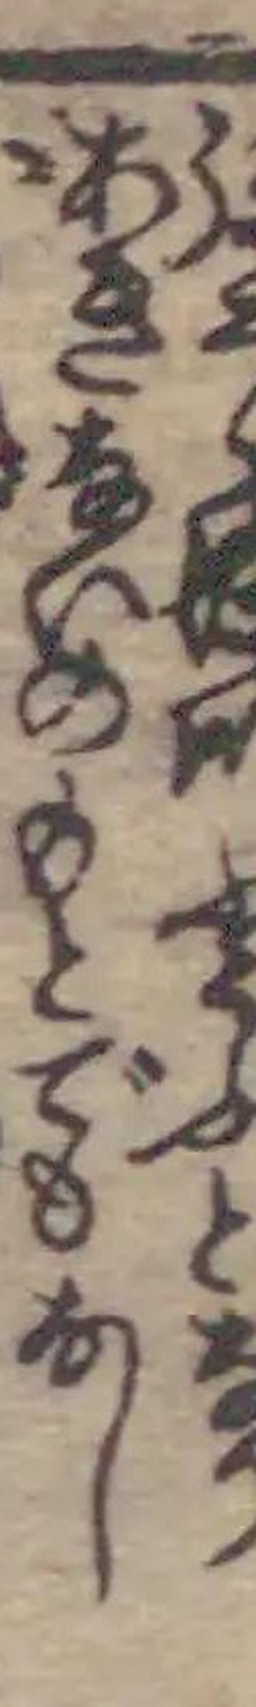あきないのもとでもなし
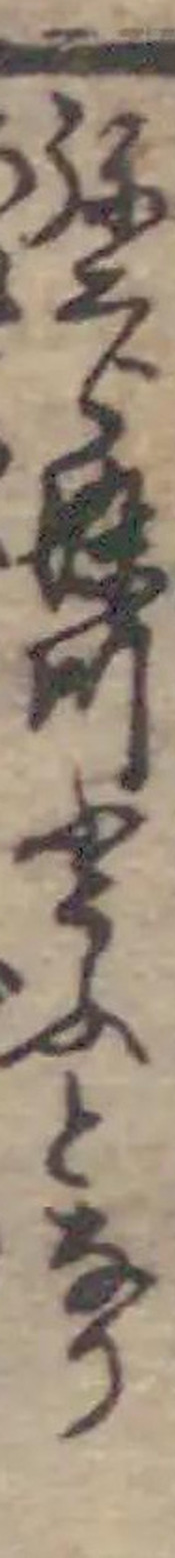弥二郎染川ふうふとなり
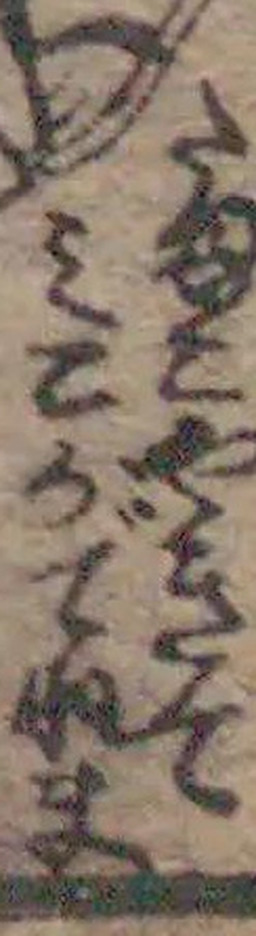みこかでれま
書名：虚言弥二郎傾城誠 3巻
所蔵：国立国会図書館 National Diet Library, JAPAN
